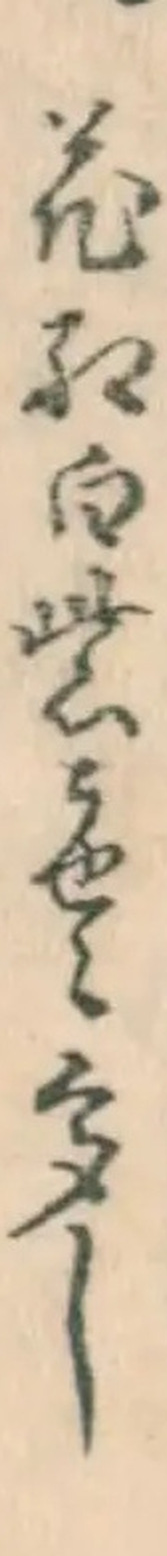花紅白紫色々多し
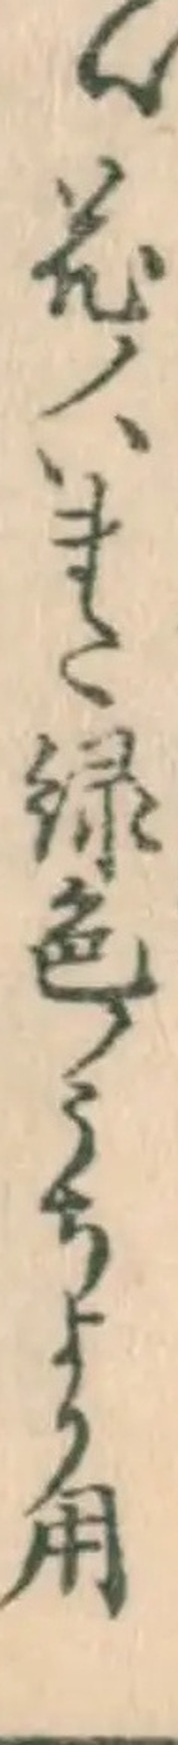花のいまた緑ノうちより用
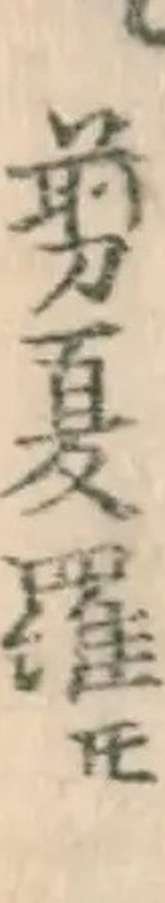剪夏羅共
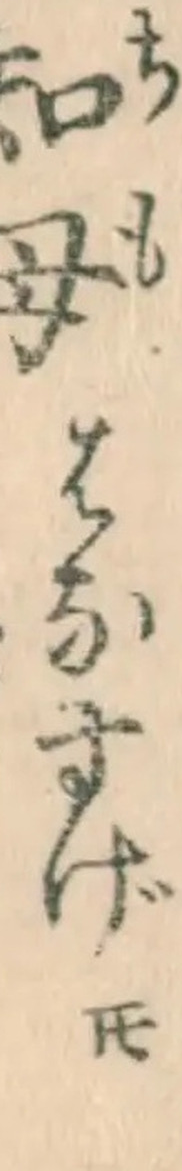知母はなすげ共
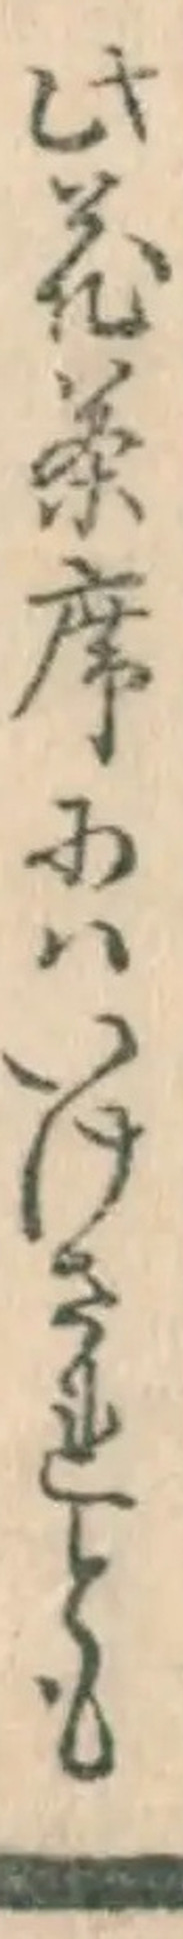白丁花此花茶席にはいけれとも
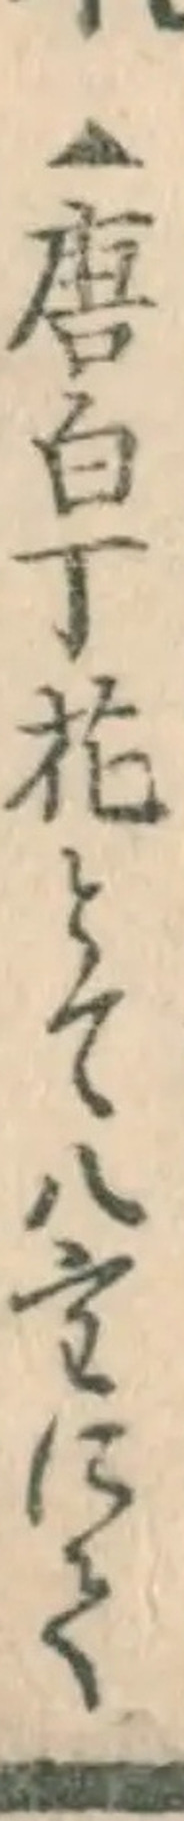▲唐白丁花とて八重にて
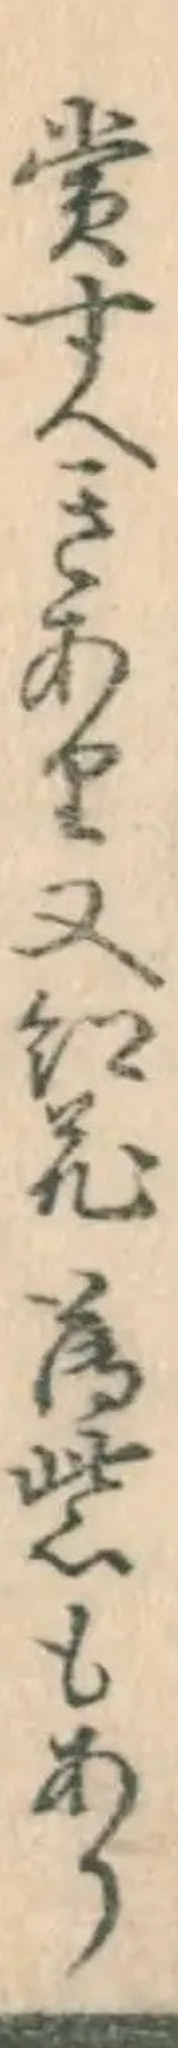賞すへきあり又紅花黄紫もあり
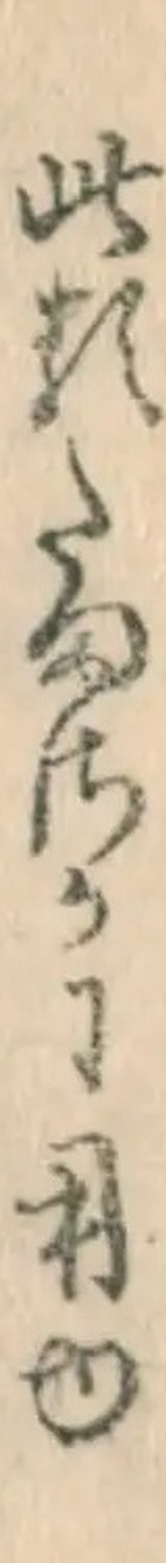此類たまさかに用ゆ

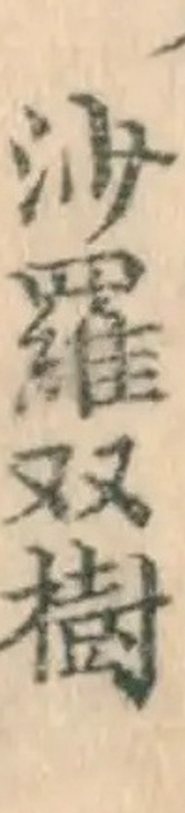沙羅双樹
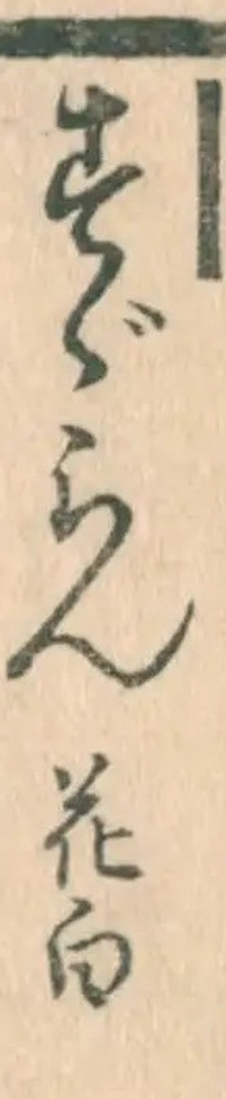すゞらん花白
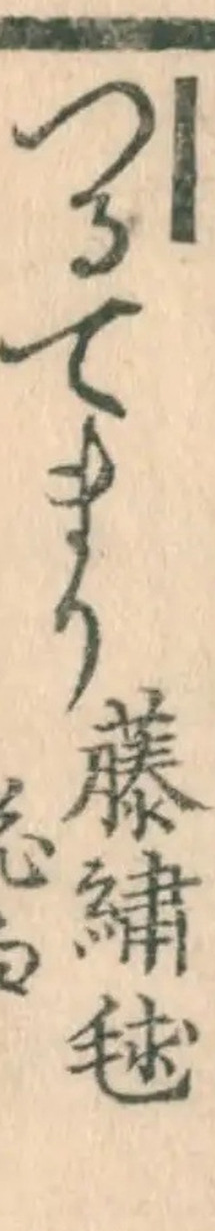つるてまり藤繍毬
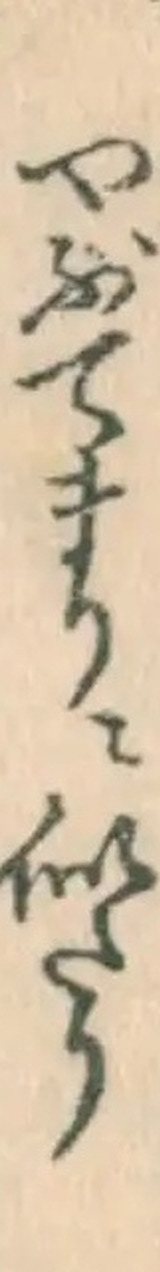やぶてまりに似たり
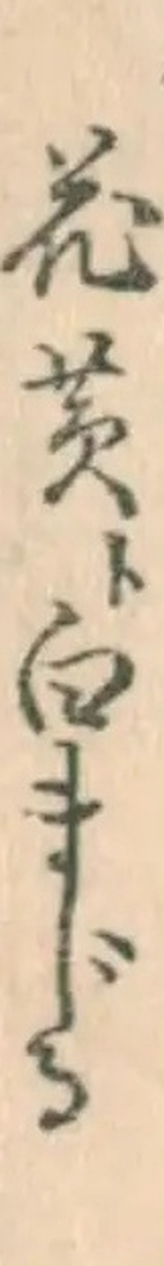花黄と白まじる
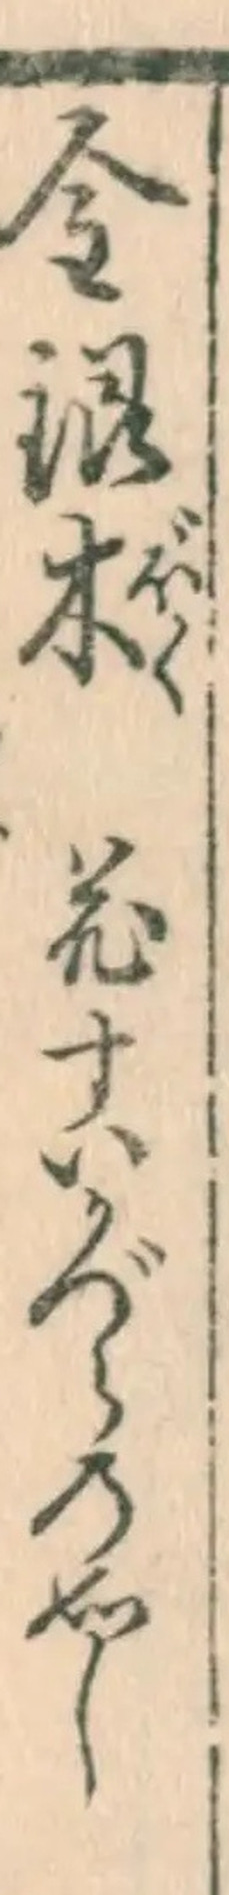金銀木花すいかづらのゆし
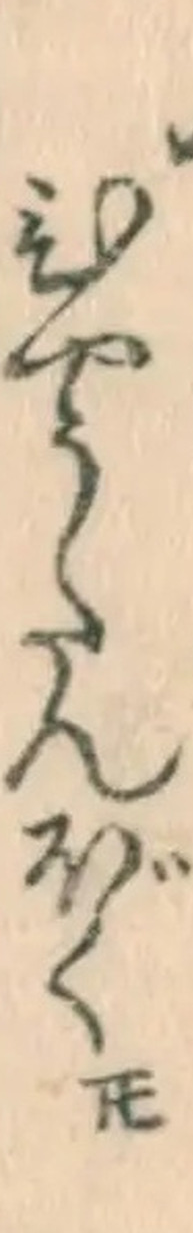しやうたんぼく共
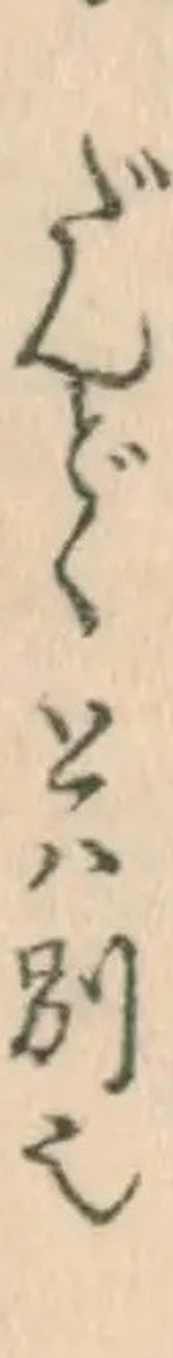だんどくとハ別也
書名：茶席挿花集
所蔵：国立国会図書館 National Diet Library, JAPAN
